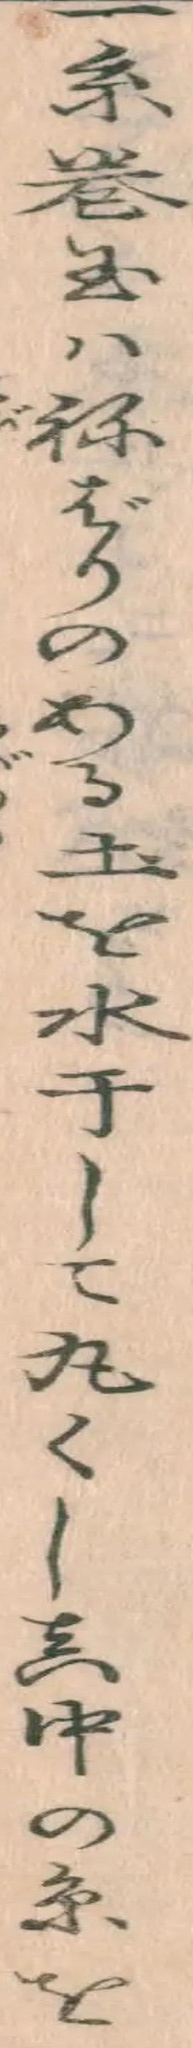一糸巻玉はねばりのある土を水干して丸くし真中の糸を
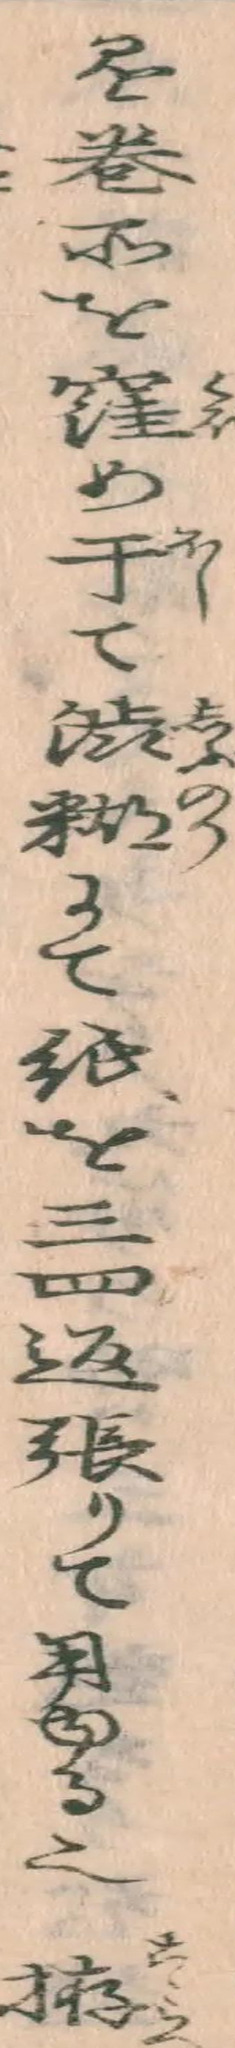懸巻所を窪め干て渋糊にて紙を三四返張りて用ゆる也拵
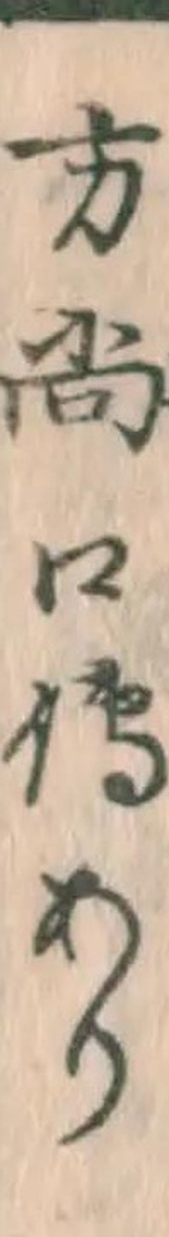方尚口伝あり
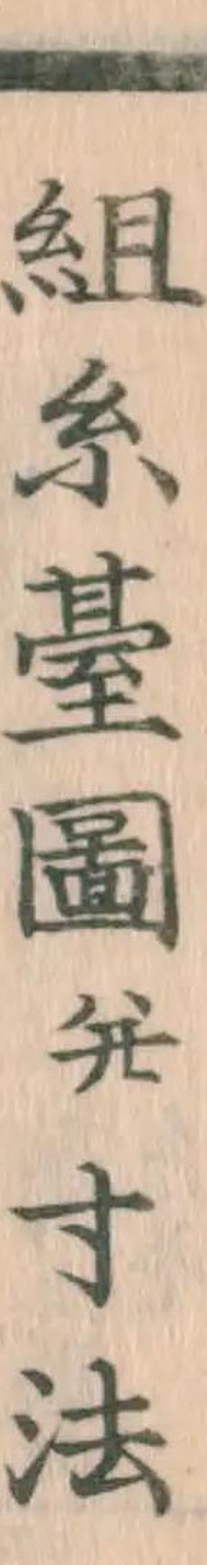組糸台図幷寸法

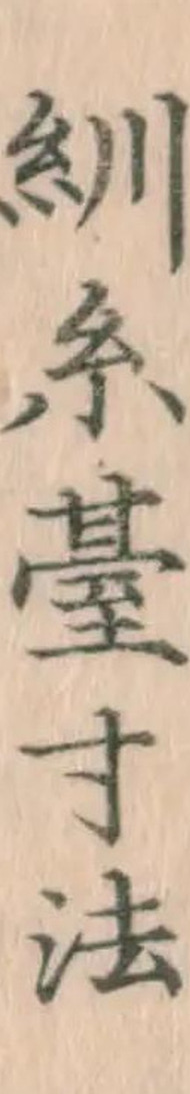紃糸台寸法
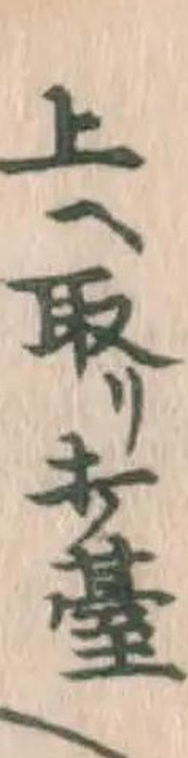上へ取り打台

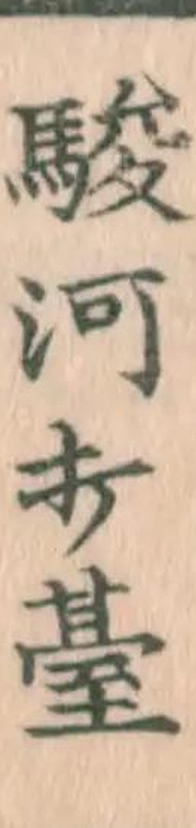駿河打台
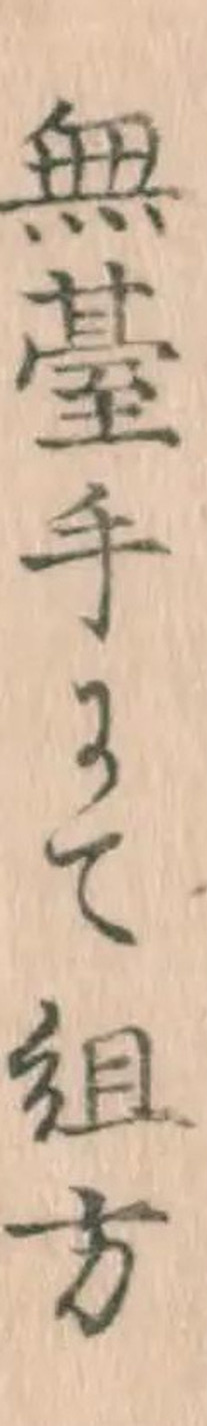無台手にて組方
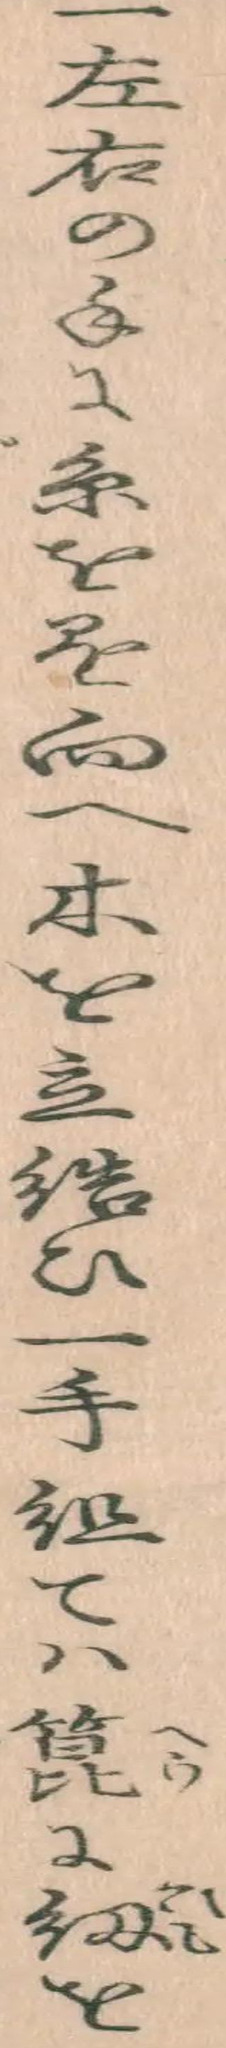一左右の手に糸を懸向へ木を立結ひ一手組ては箆に紐を
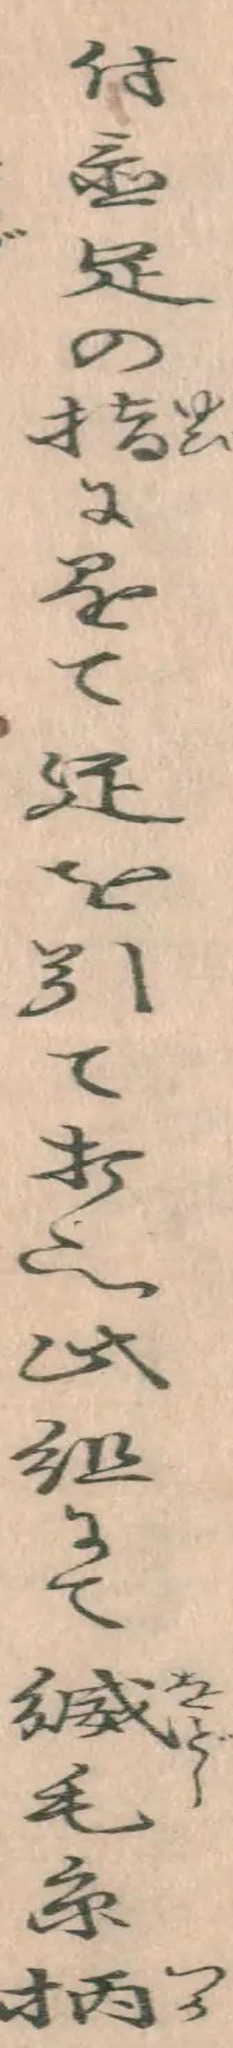付置足の指に懸て足を引て打也此組にて縅毛糸柄
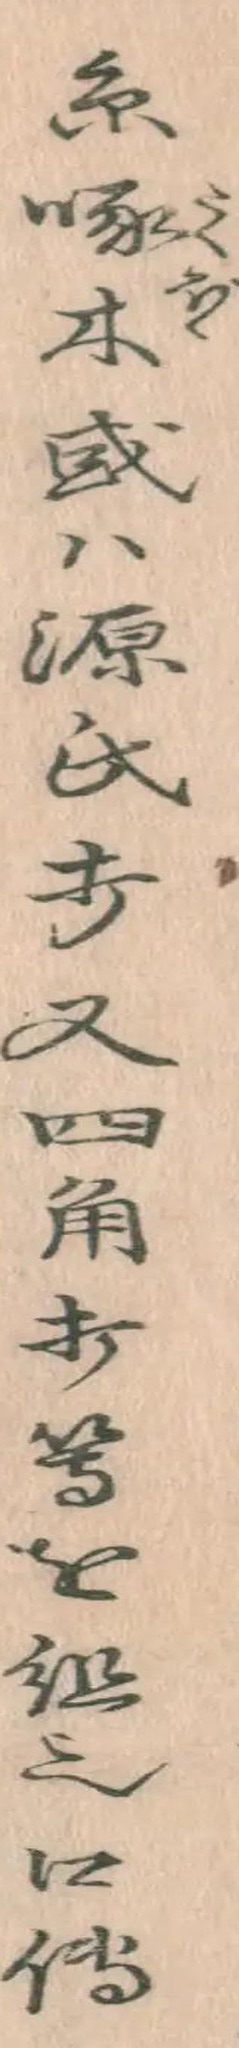糸啄木或は源氏打又四角打等を組也口伝
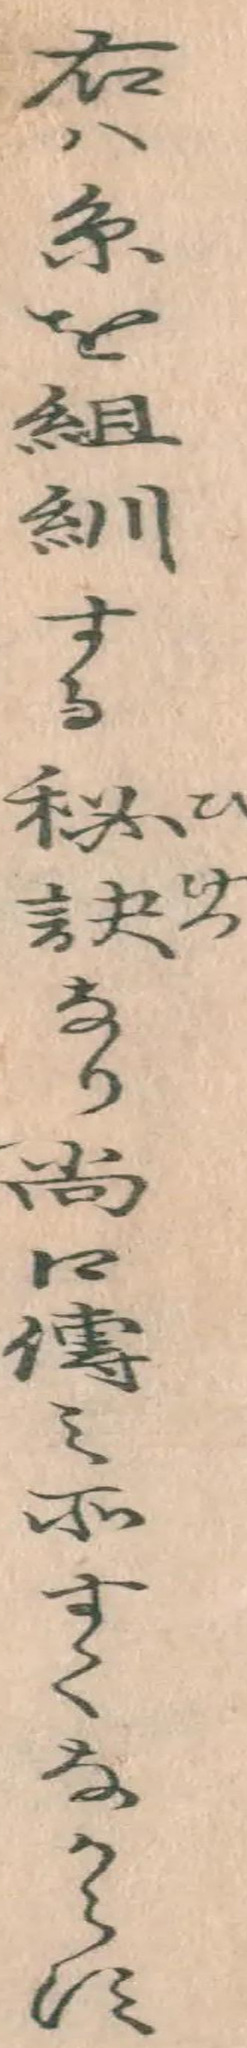右は糸を組紃する秘訣なり尚口伝之所すくなからす
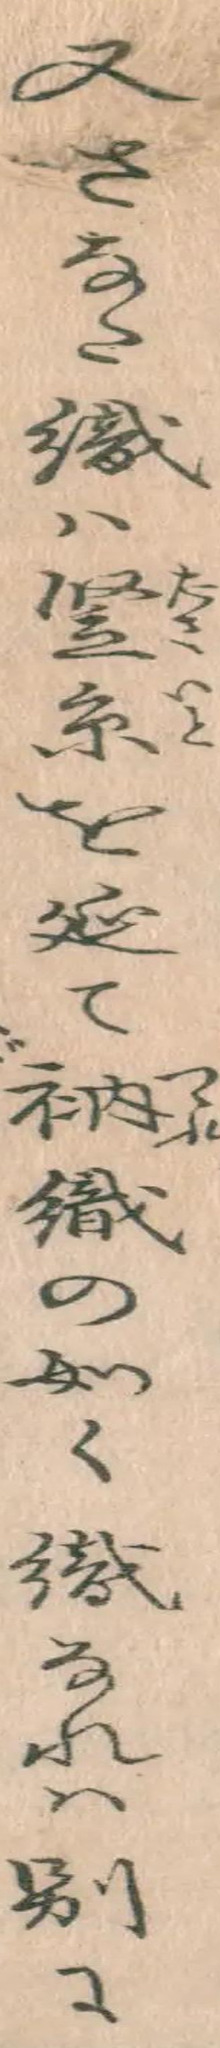又さなた織は竪糸を延て衲織の如く織なれは別に
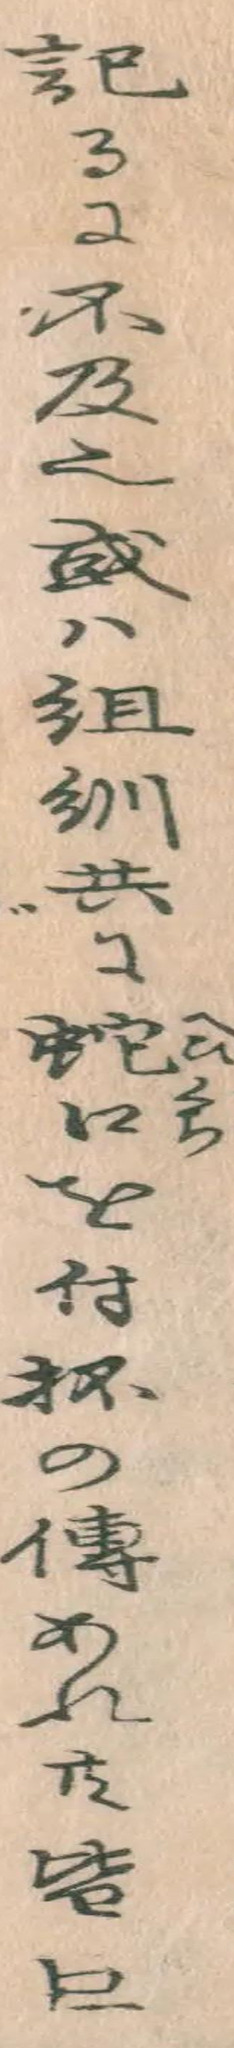記るに不及也或は組紃共に蛇口を付抔の伝あれ共皆巨
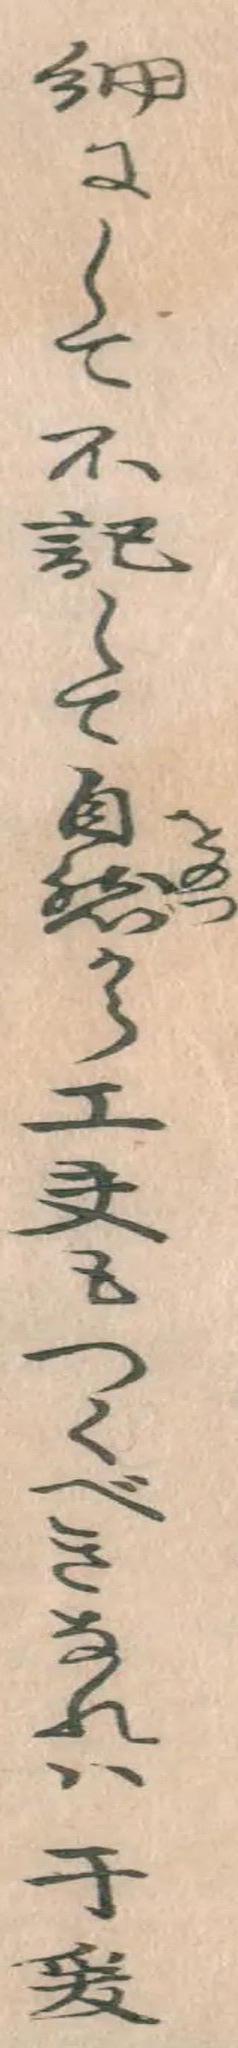細にして不記して自然から工夫もつくべきなれは于爰
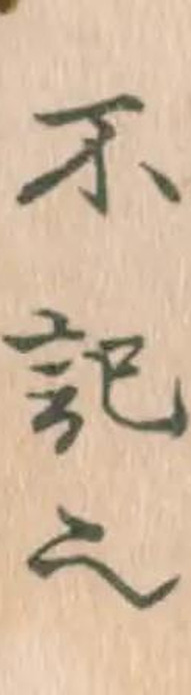不記也
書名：機織彙編 5巻. [2]
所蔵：国立国会図書館 National Diet Library, JAPAN
